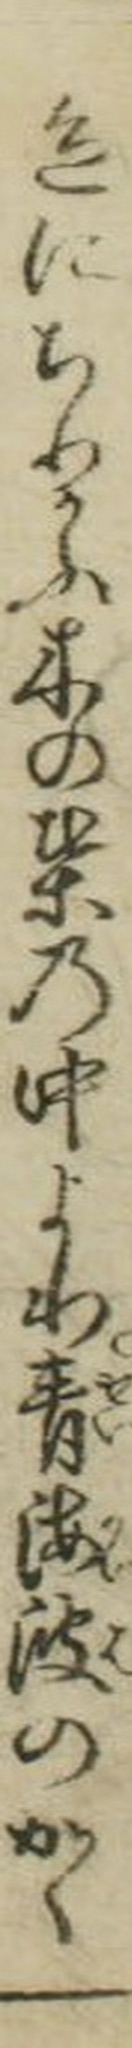辺にちりかふ木の葉の中より。青海波のかゝ
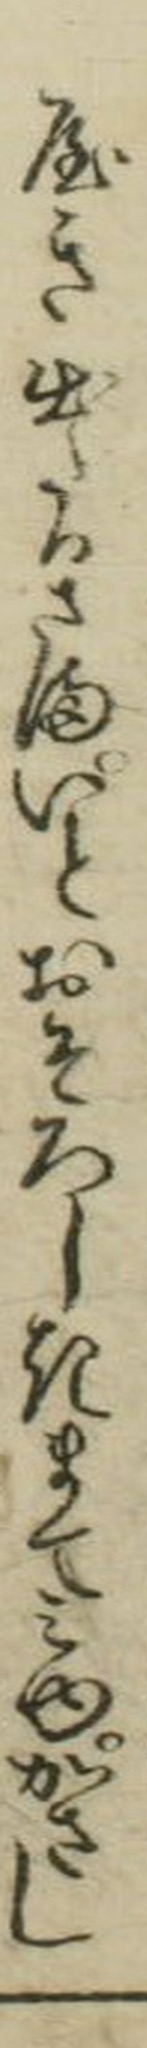やき出たるさま。いとおそろしきまてみゆ。かさし
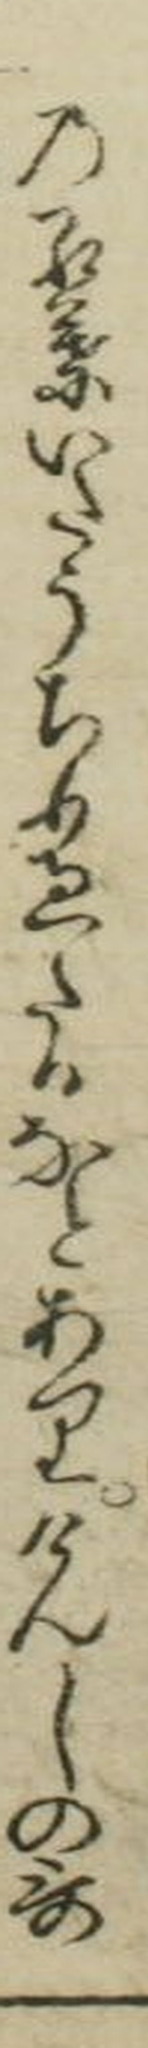の紅葉いたうちりへたるなとあり。けんしの哥
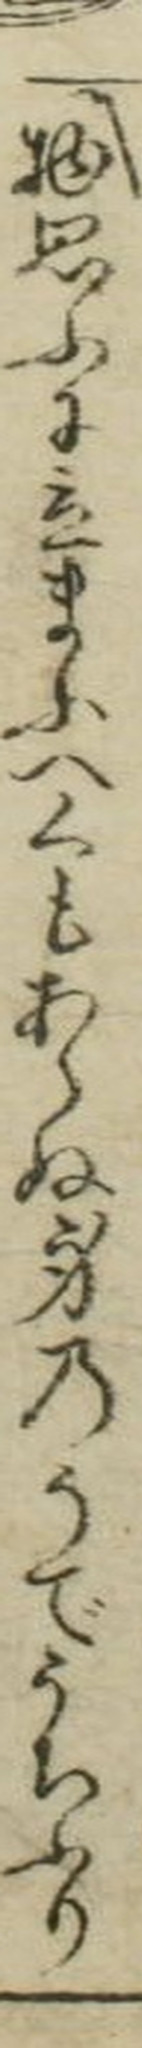〽物思ふに立まふへくもあらぬ身のうでうちふり
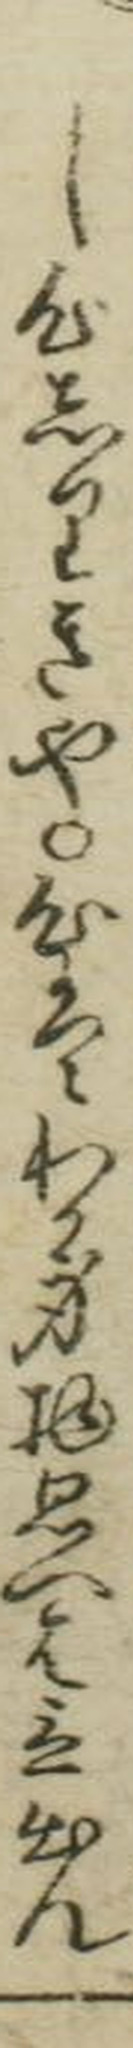し心しりきや◯心はわか身物思へは立出ん
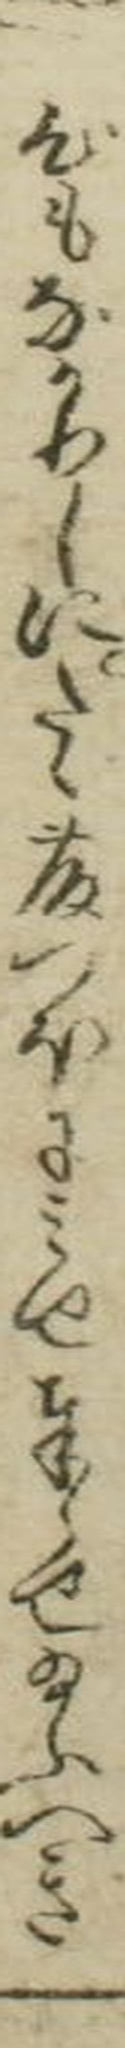心もなかりしに。たゝ藤つほにみせ奉らせ給ふへき
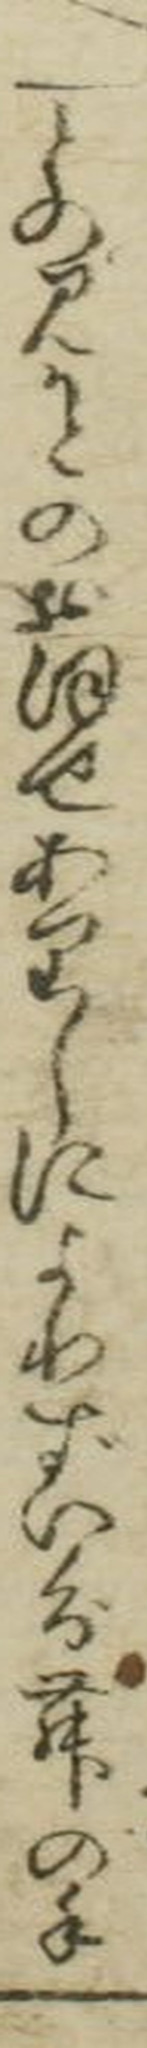とのみかとのおほせありしによりずい分舞の手
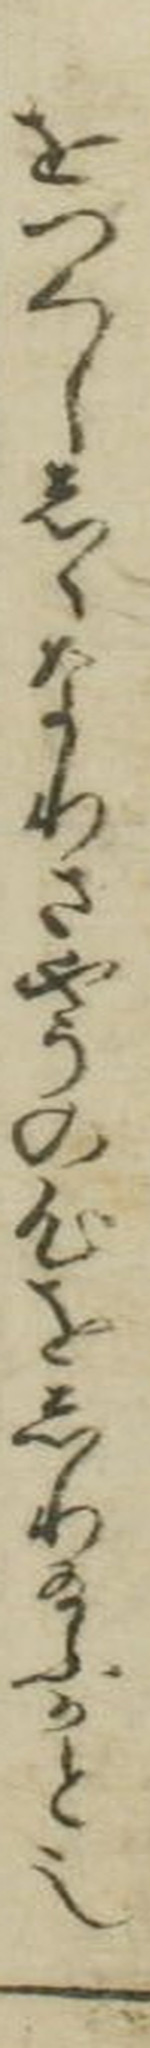をつくししくなりさやうの心をしり給ふかと也
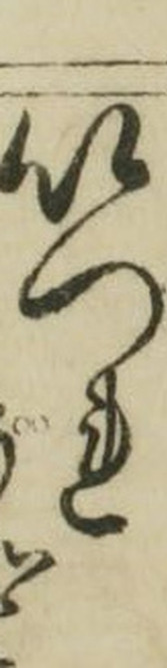いづれ
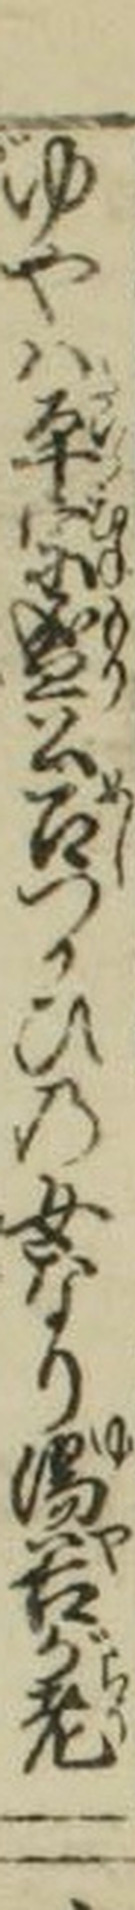ゆやは平宗盛公召つかひの女なり湯谷が老
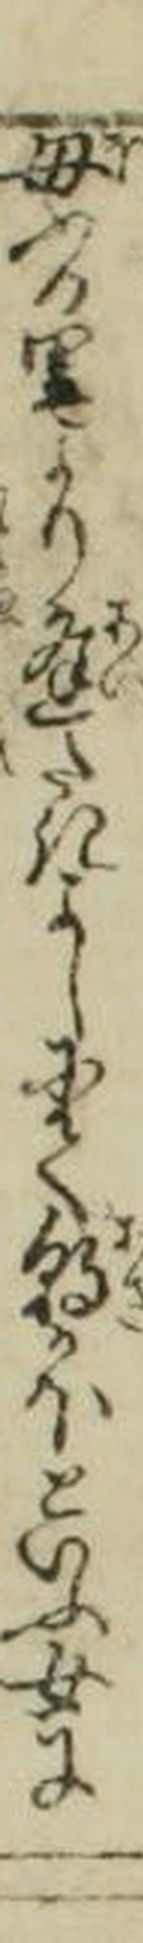母ふる里より逢たきよしにて朝かほといふ女に
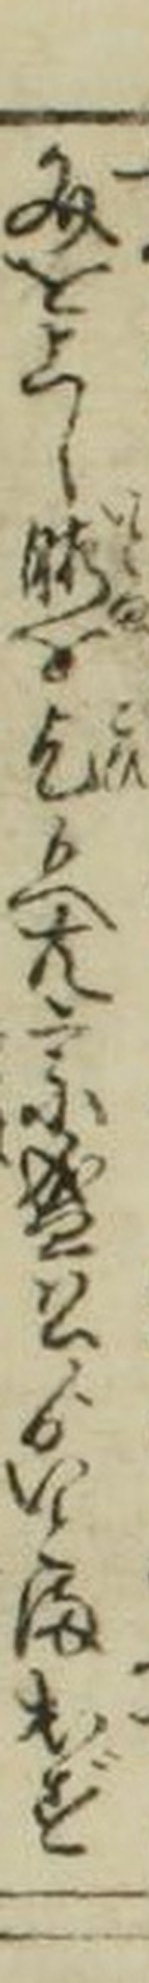みを上し暇を乞候へ共宗盛公よりいとま出ず
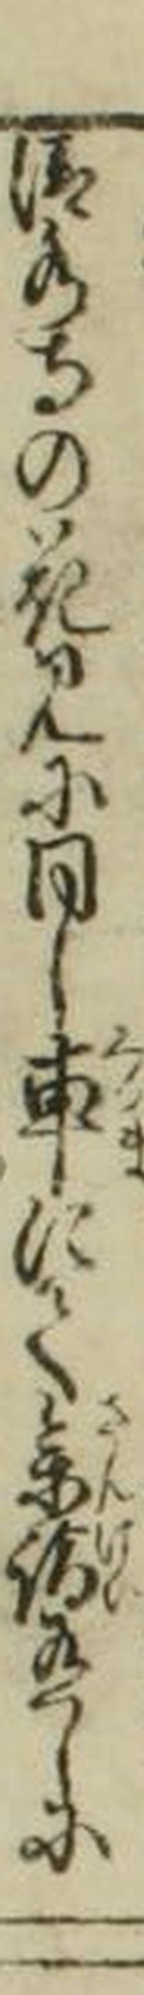清水寺の花見に同し車にて参詣有しに
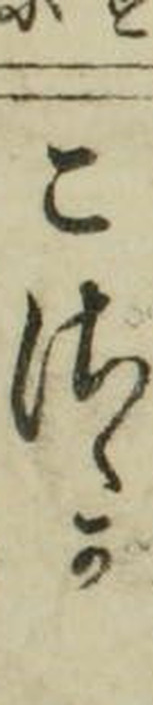こさゝが
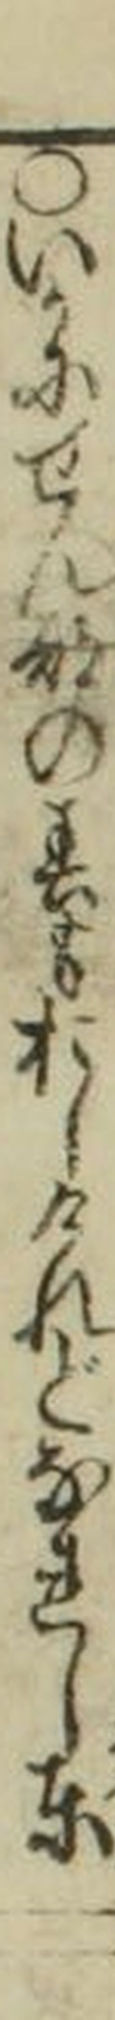○いかにせん都の春もおしけれどなれし東
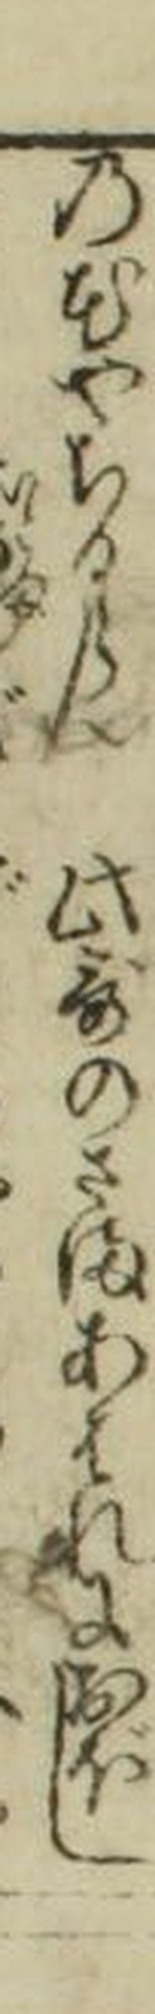の花やちるらん此哥のさまあはれにおぼし
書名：女源氏教訓鑑
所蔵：東京学芸大学附属図書館
